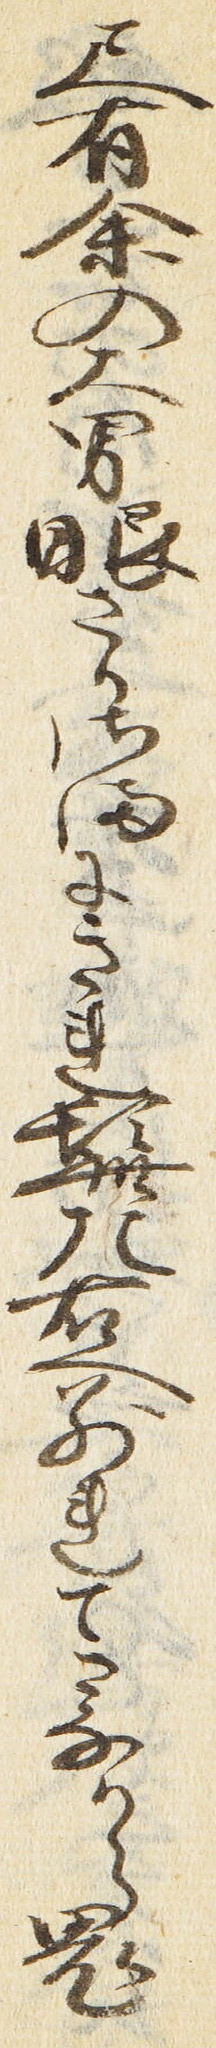尺有余の大男眼さかさまにきれ髭左右へ別れてさなから鬼
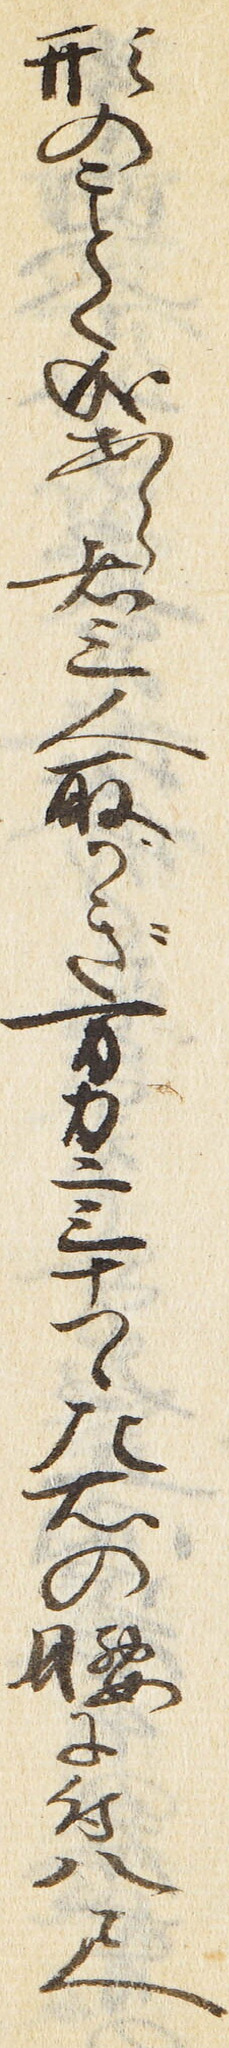形のことく成あら者三人取かぎ万力二三十つゝ左右の腰に付八尺
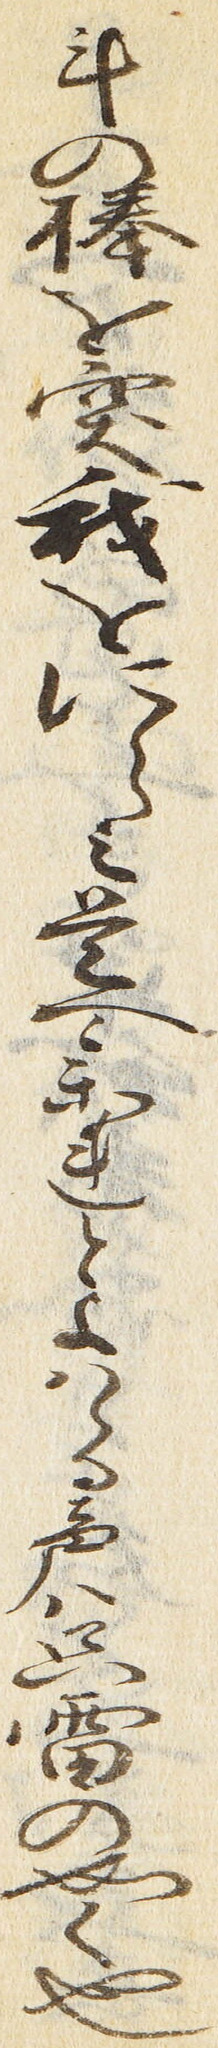斗の棒を突我をにらみ是へ参れとよはゝる声は只雷の如く也
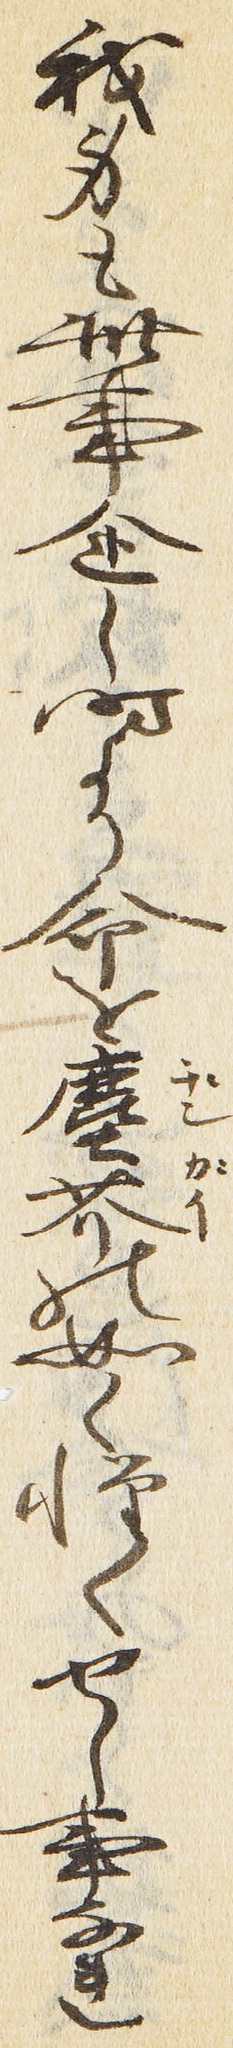我身も此事企し時より命を塵芥の如く軽くせし事なれ
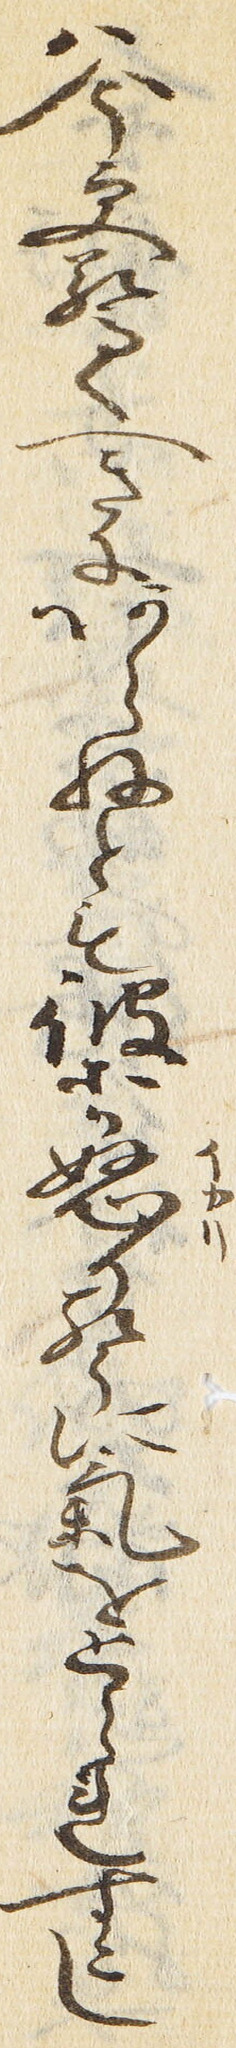は今更驚くへきにあらねとも彼等か怒り声に気をとられすこし
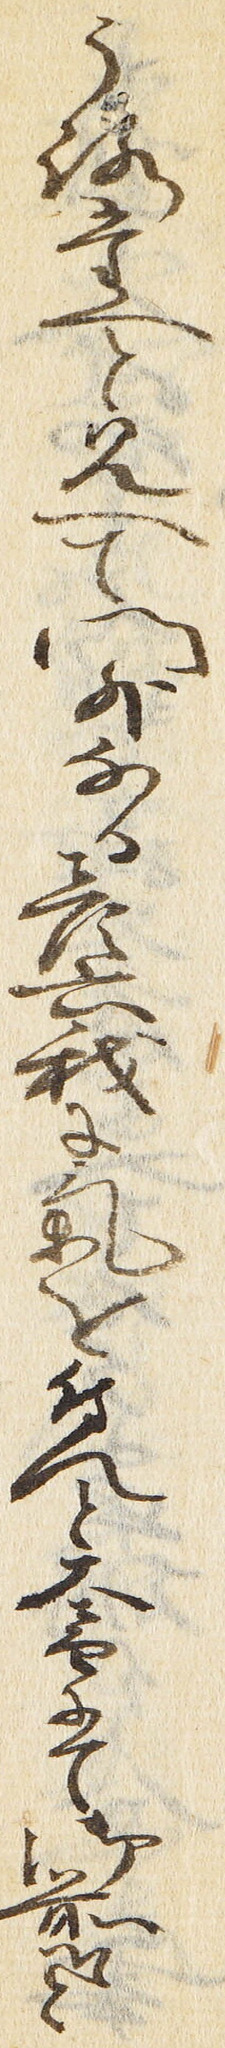うろたへと見へて門外なる彦六我に気を付んと大音にて御前そと
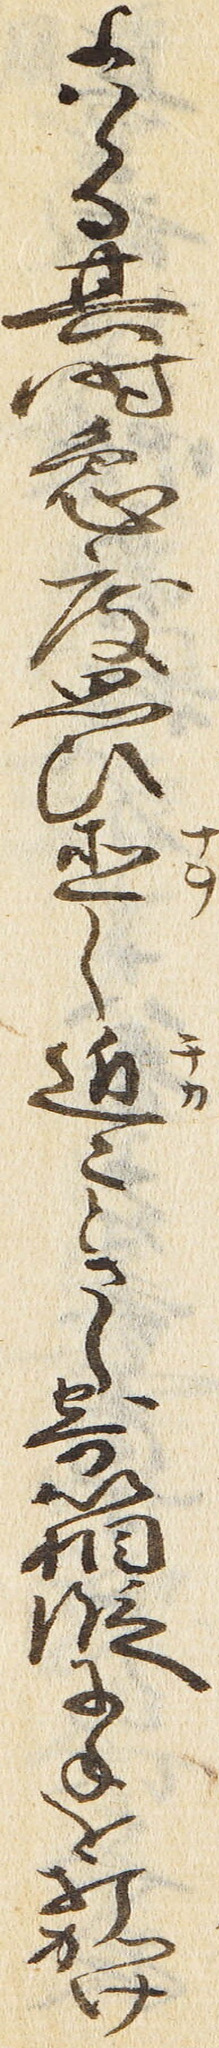よはゝる其時急度思ひ直し近々とさし寄箱段に手を打かけ
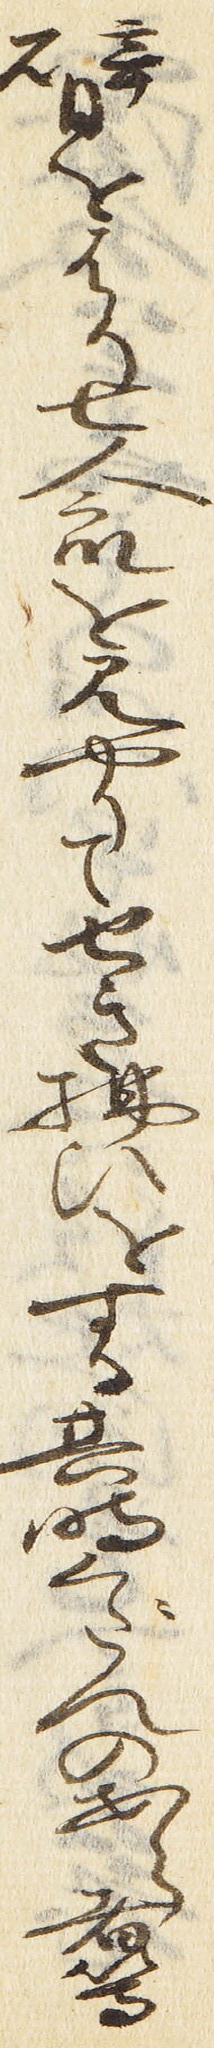臂をはり七人衆を見やりてせき払ひをする其時くだんのあら者等
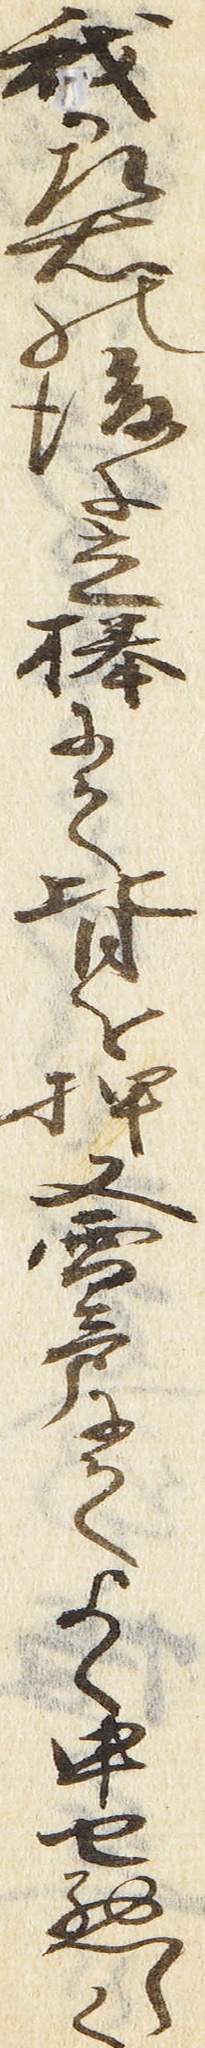我か左右の後に立棒にて背を押又雷声にてよく申せ悪しく
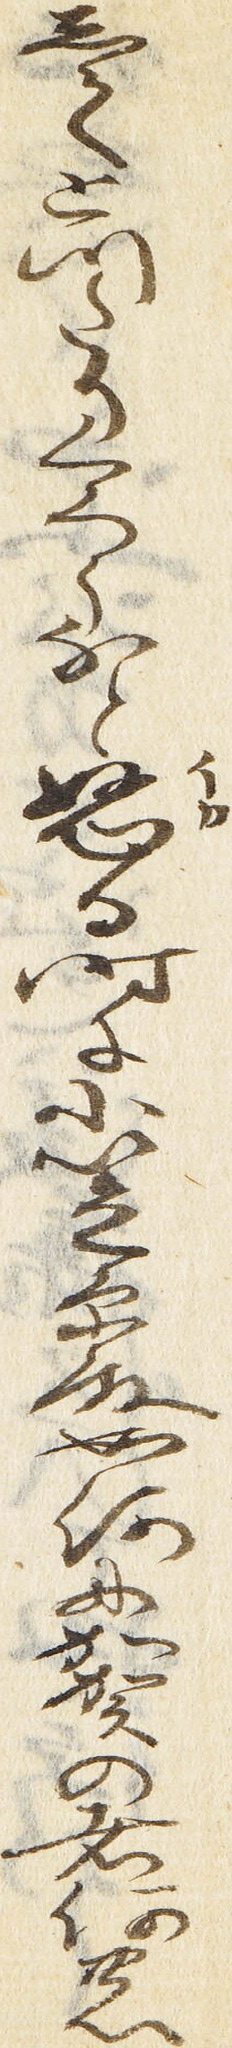してとつたりくろうなと怒る時に小笠原殿如何に加賀の者何の
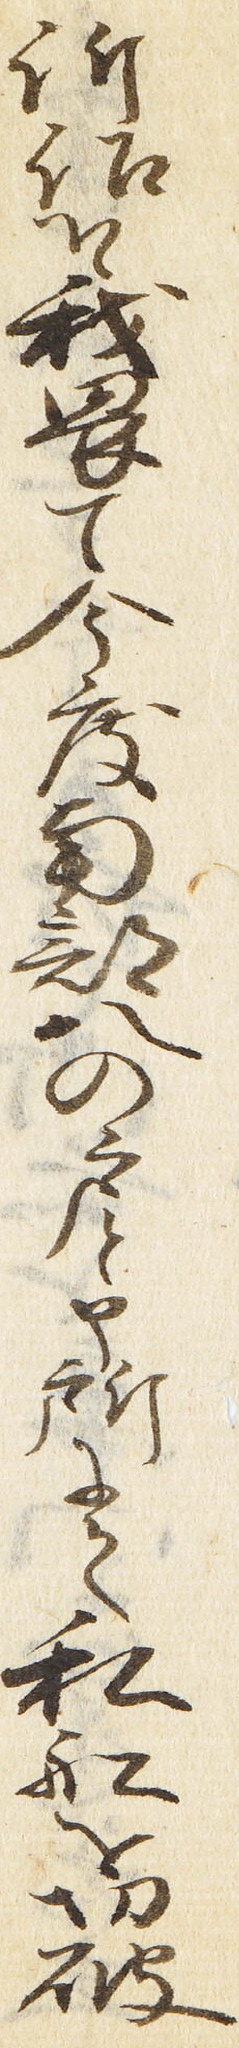訴訟そ我畏て今度南部八の戸と申所にて私船を切破
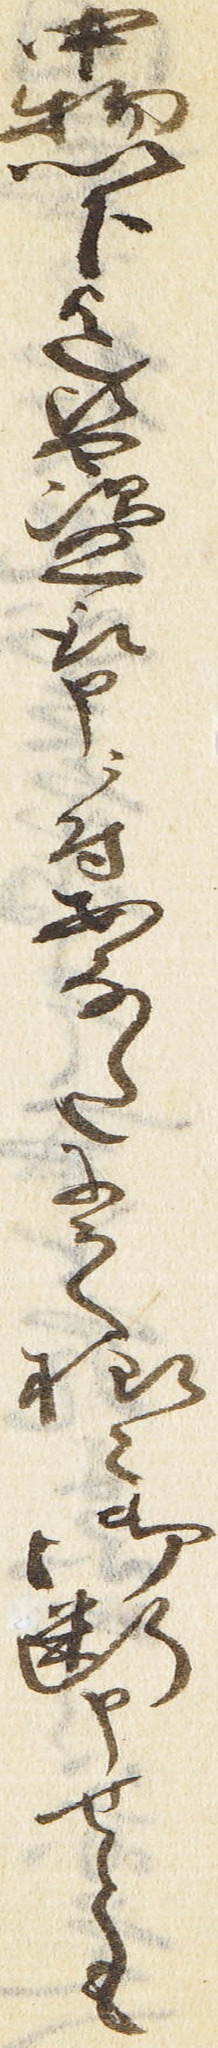中物以下迄皆盗取申に付あなたにて様々御断申せとも
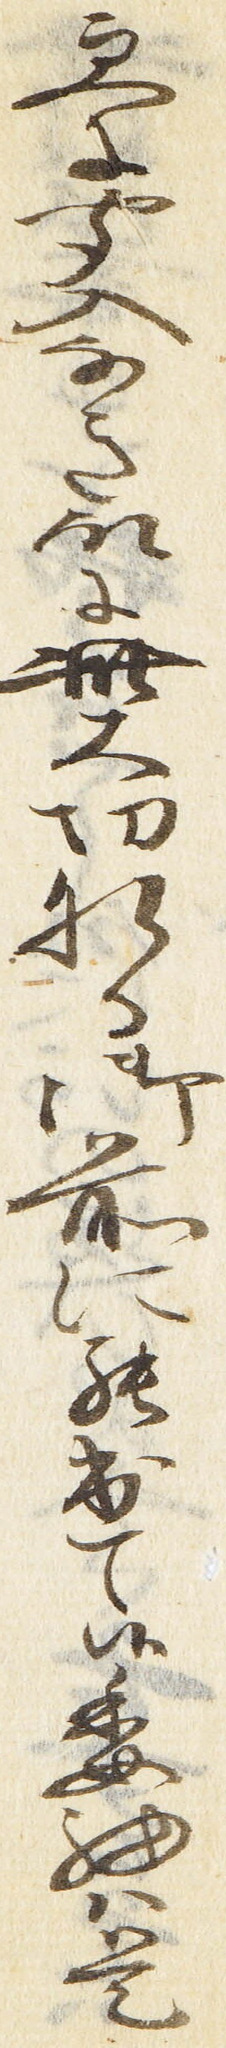更に聞入なき故に此大切なる御前に罷出て候委細は是
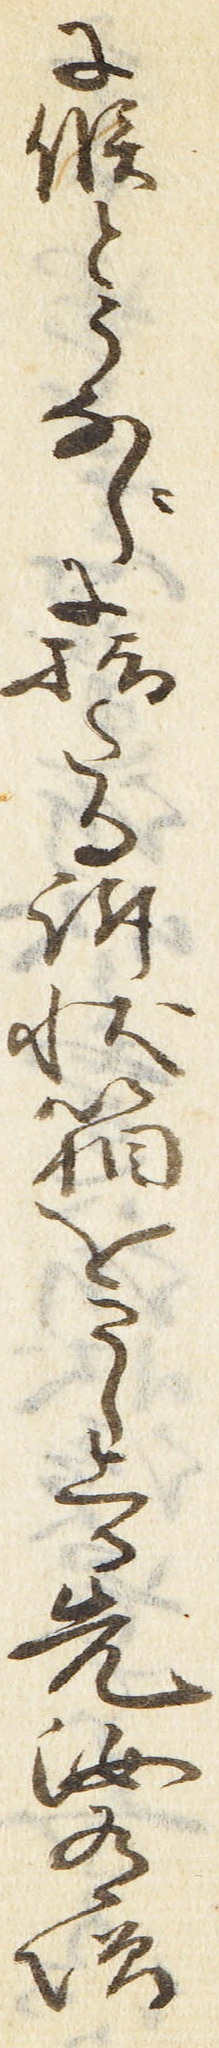に候とうなじに指たる訴状箱をさし上る先汝有増
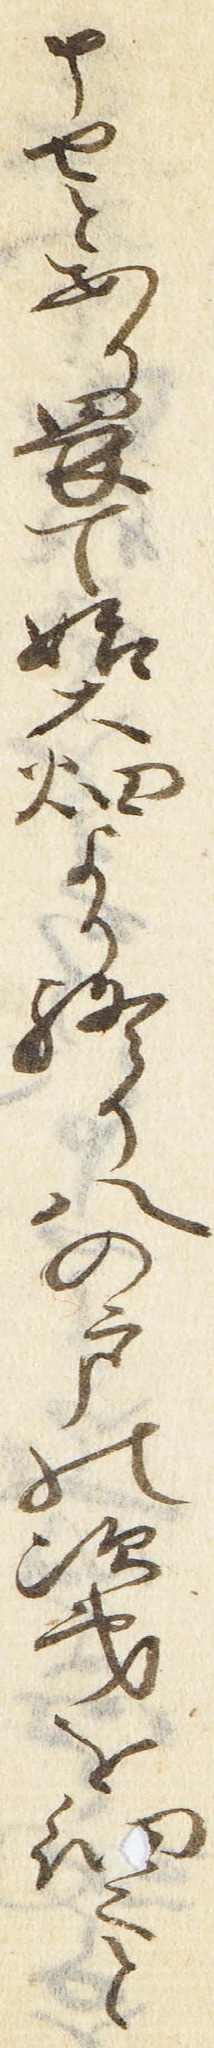申せとあり畏て始大畑より終り八の戸の次第を細々と
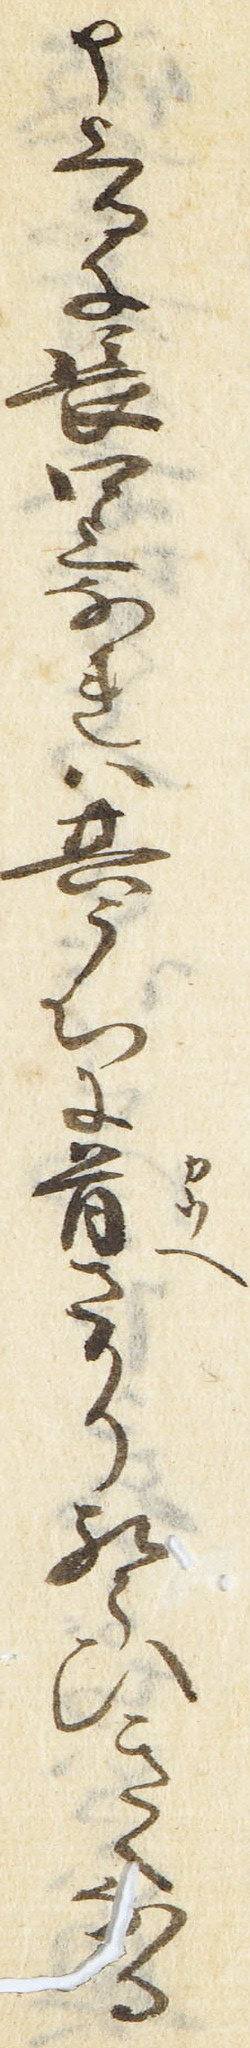申上るに長口上なれは其うちに首さかり声ひきくなる
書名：海陸世話日記
